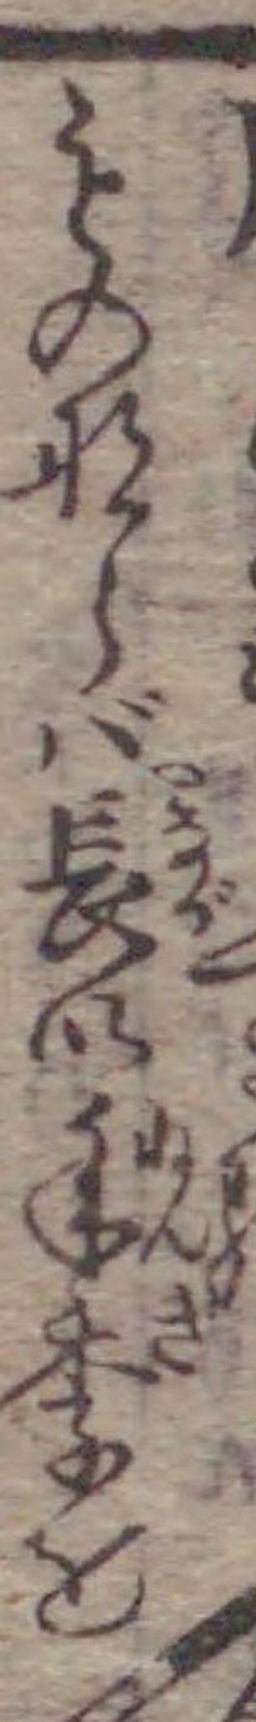ものならば。長い年季を
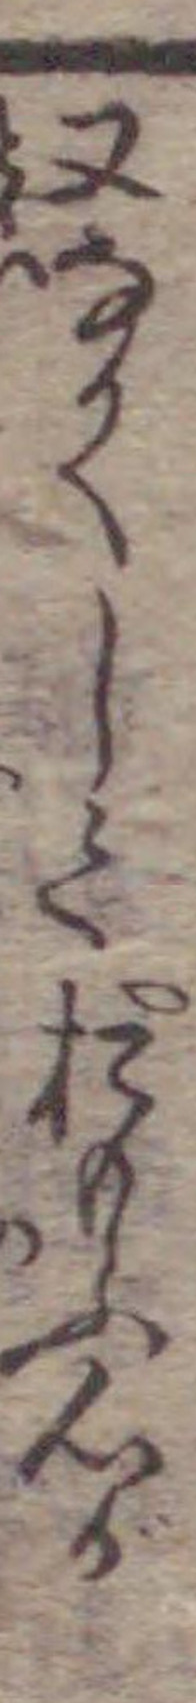又なかくして。おもふ心が
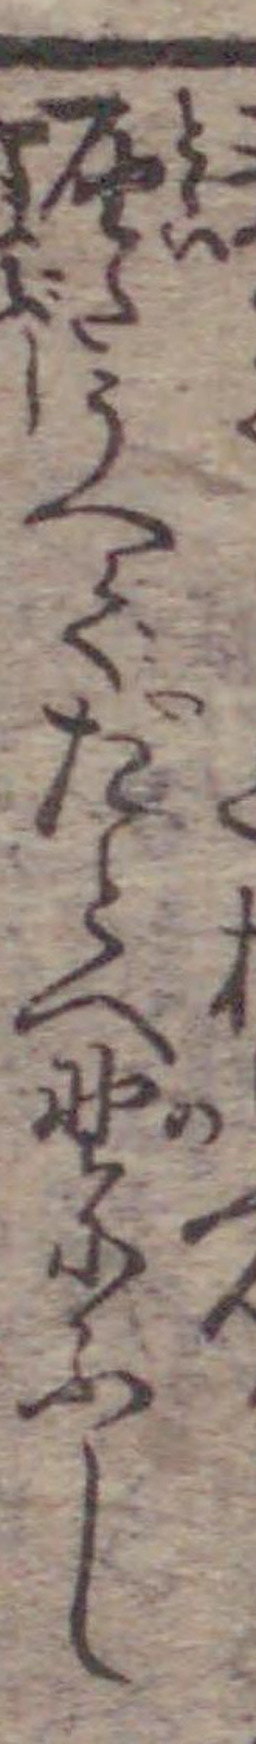届たうへて。たとへ野にふし
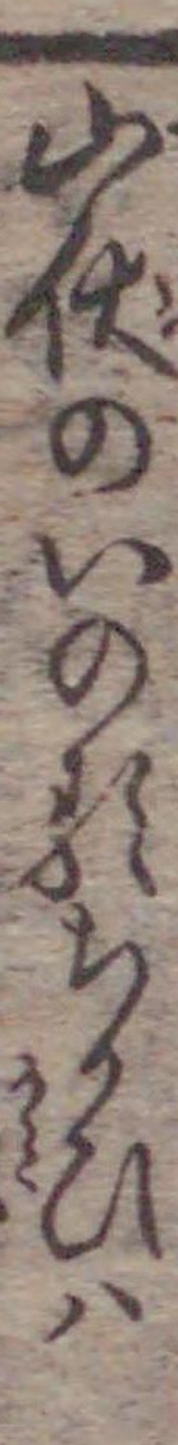山伏のいのるちかひは
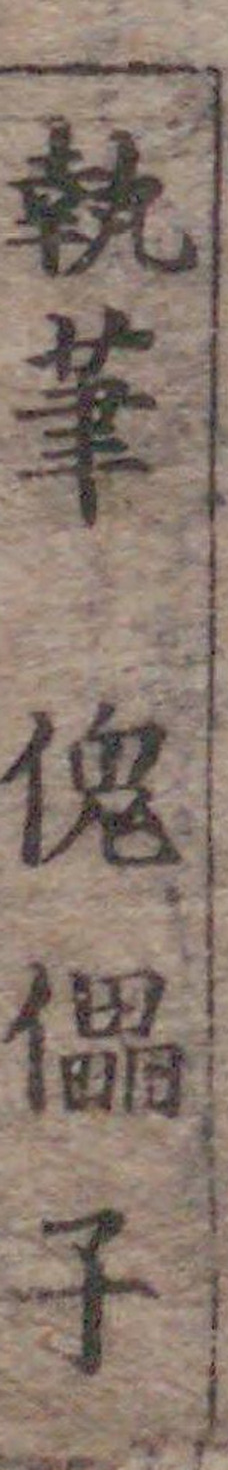執筆傀儡子
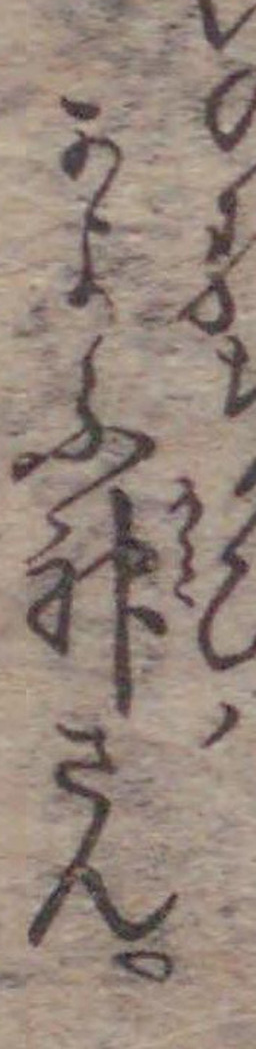かよふ神さん。
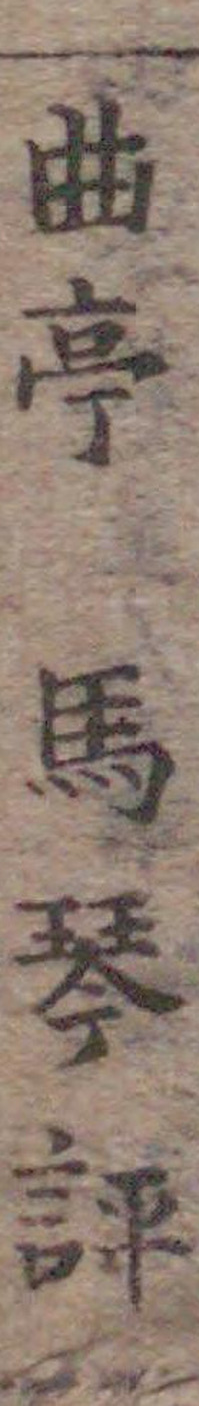曲亭馬琴評

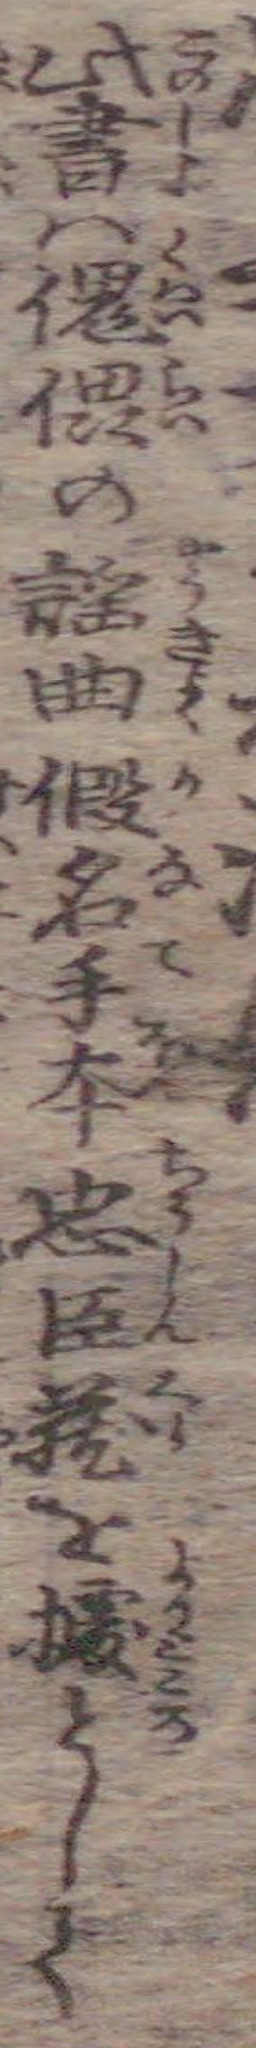此書は傀儡の謡曲仮名手本忠臣蔵を拠
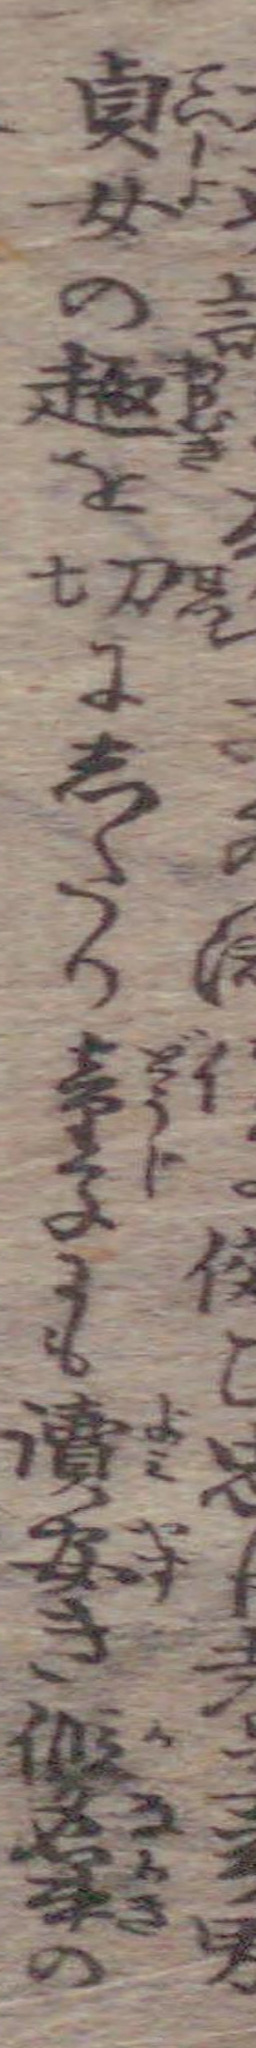貞女の趣を切にしたり童子にも読安き仮名書の
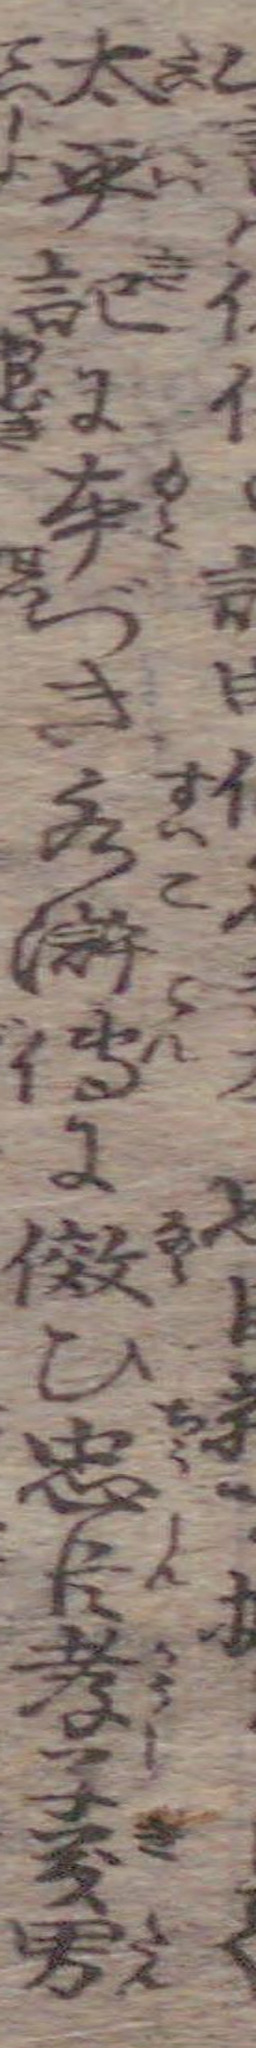太平記に本づき水滸伝倣ひ忠臣孝子義男
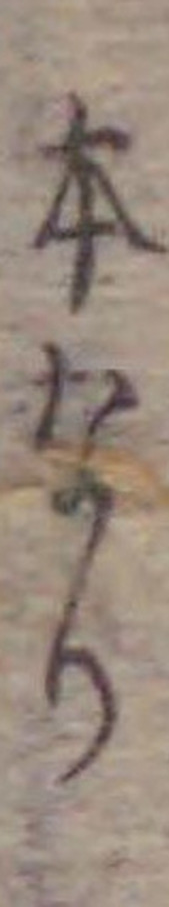本なり
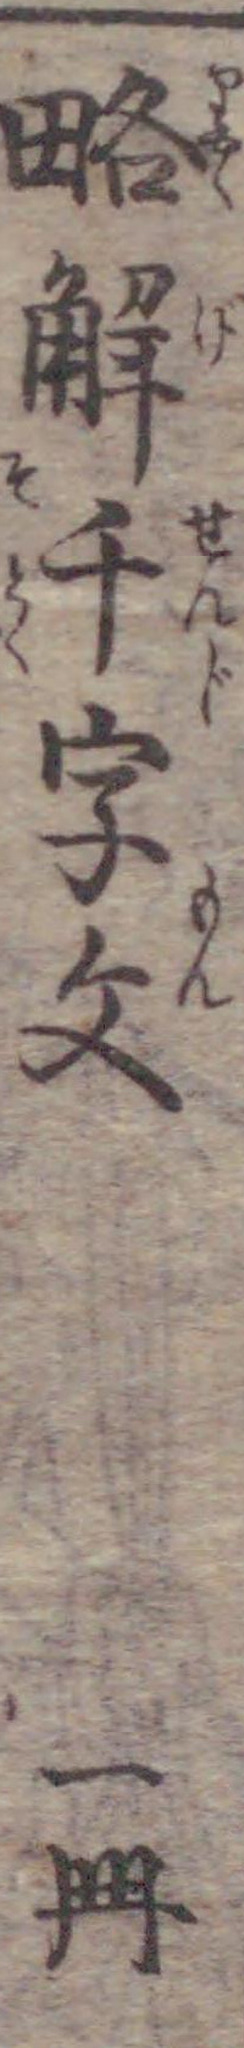略解千字文一冊
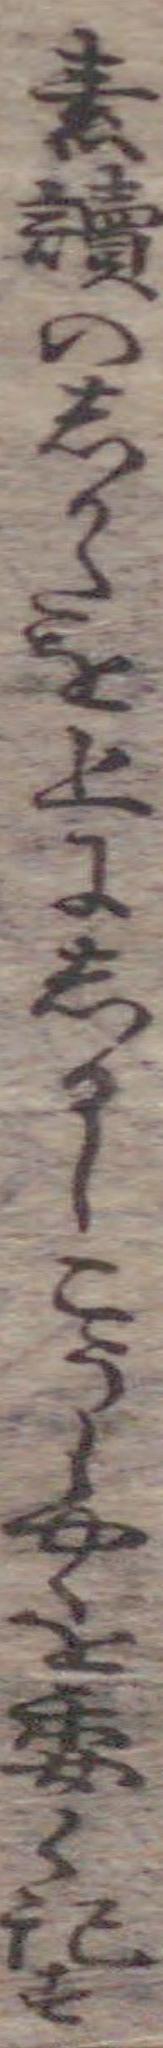素読のしかたを上にしるしこうしやくを委く記す
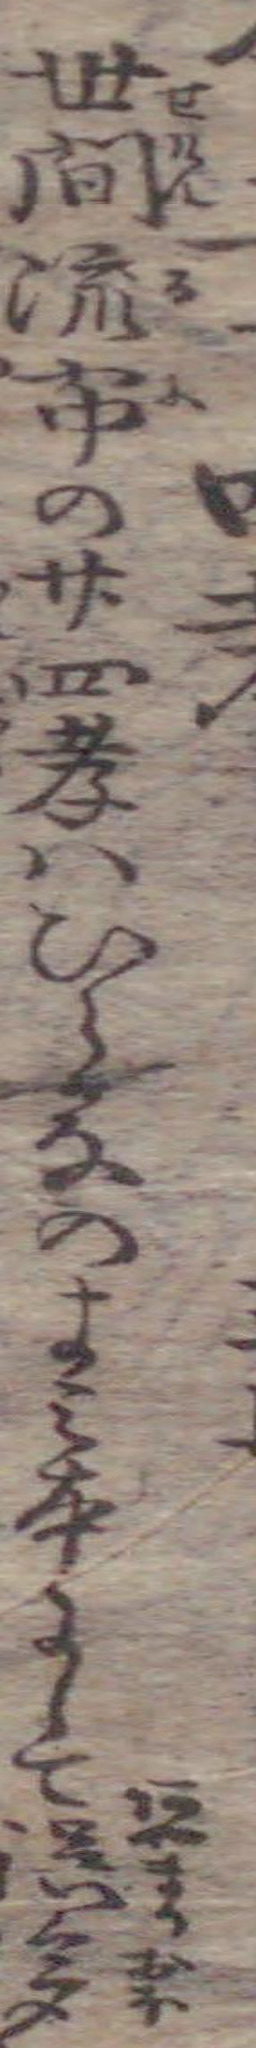世間流市の廿四孝はひらなのよみ本にして誤多し
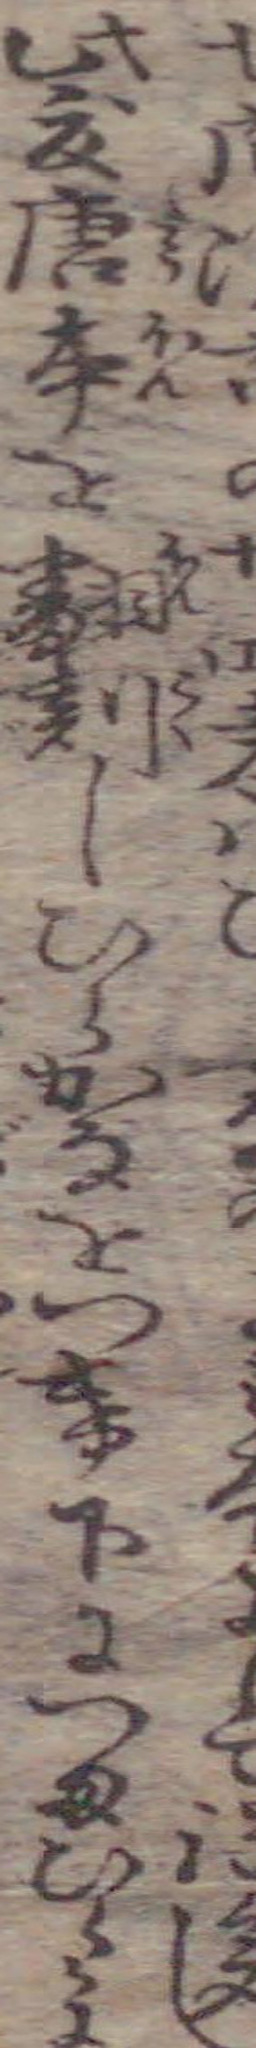此度唐本を翻刻しひらかなをつけ下につまひらかに
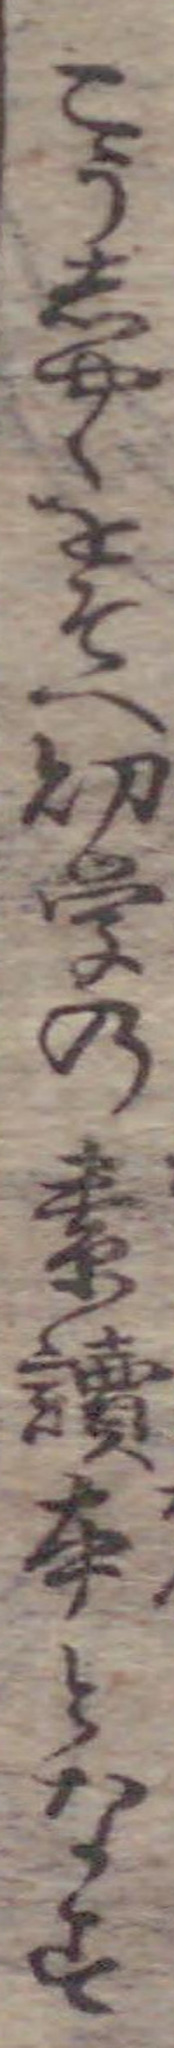こうしやくをそへ幼学の素読本となす
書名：武者合天狗俳諧 : 2巻
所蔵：国立国会図書館 National Diet Library, JAPAN
